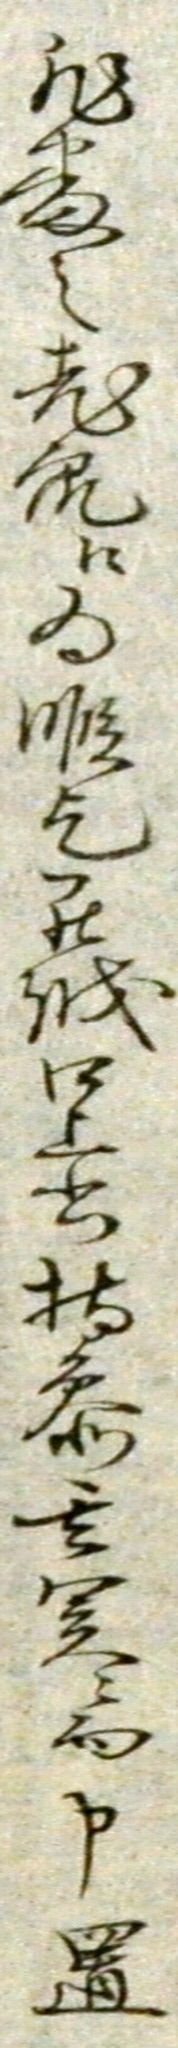非番之老衆江為暇乞罷越口上書持参玄関ニ而申置
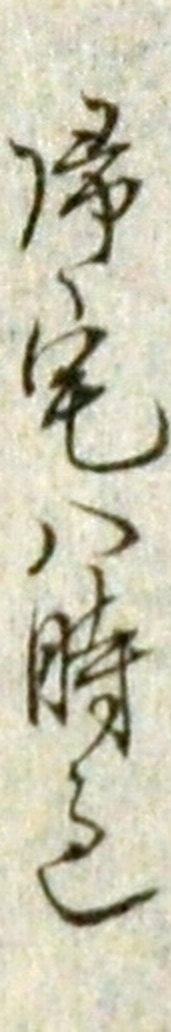帰宅八時過

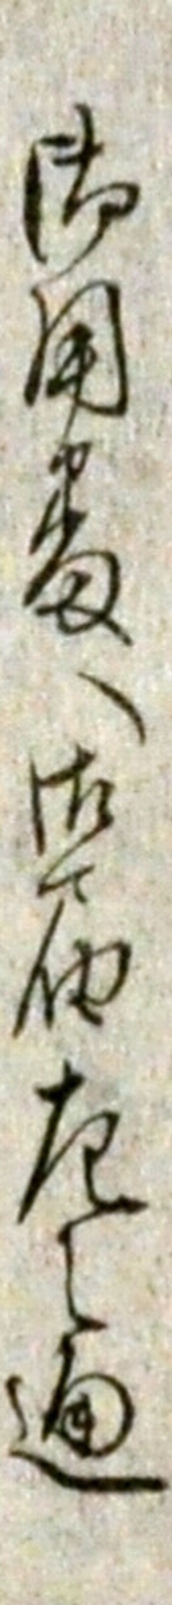御用番へ御届左之通
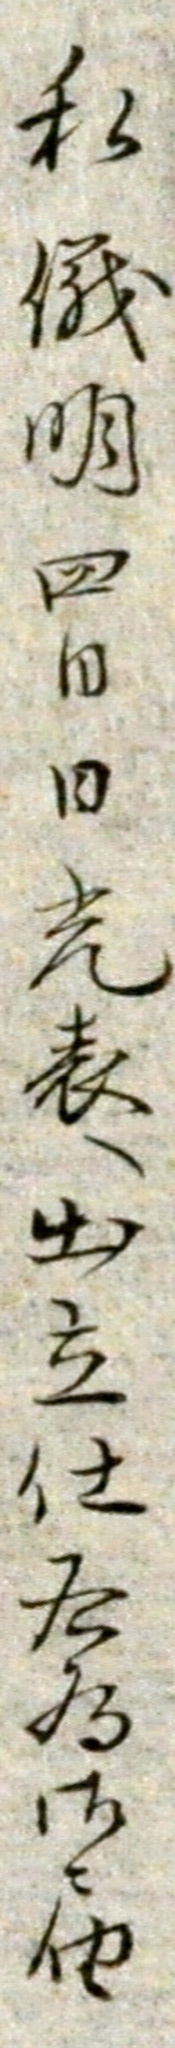私儀明四日日光表へ出立仕候為御届
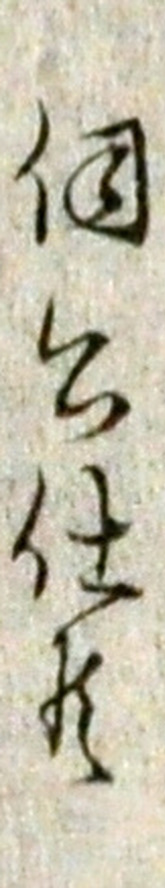伺公仕候
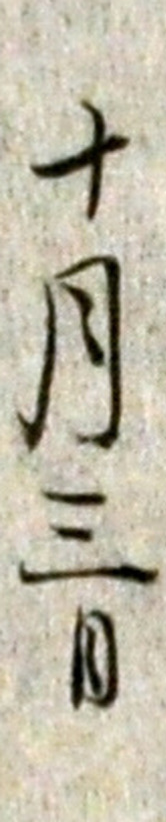十月三日
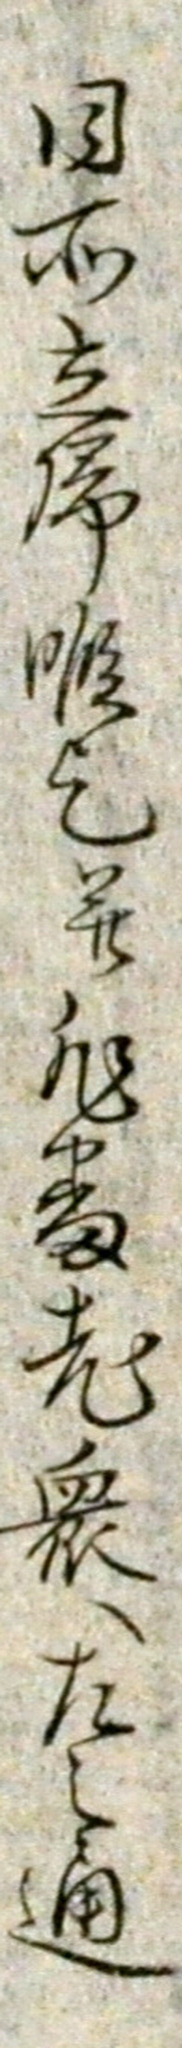同所立帰暇乞幷非番老衆へ左之通
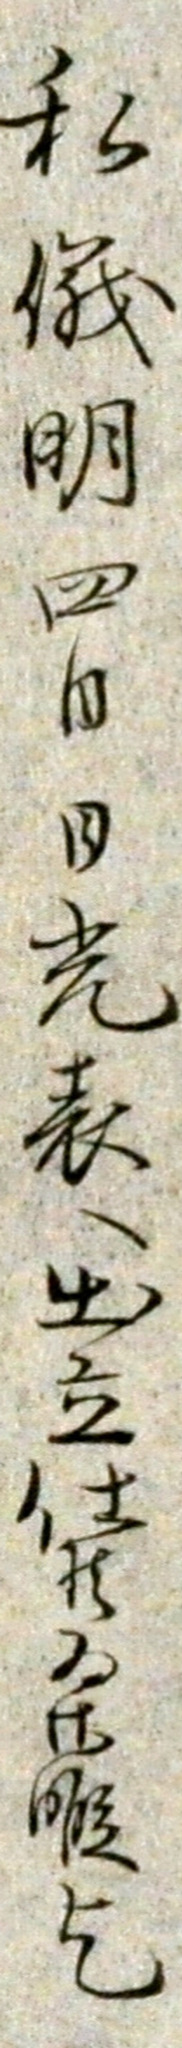私儀明四日日光表へ出立仕候為御暇乞
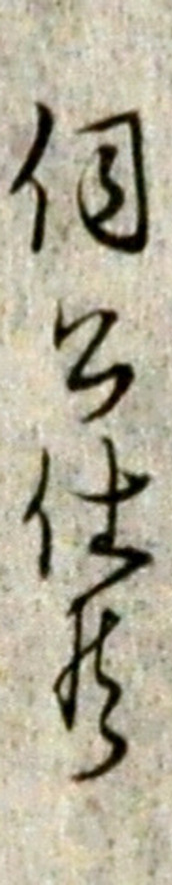伺公仕候
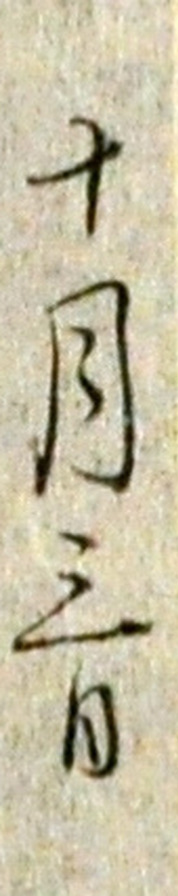十月三日
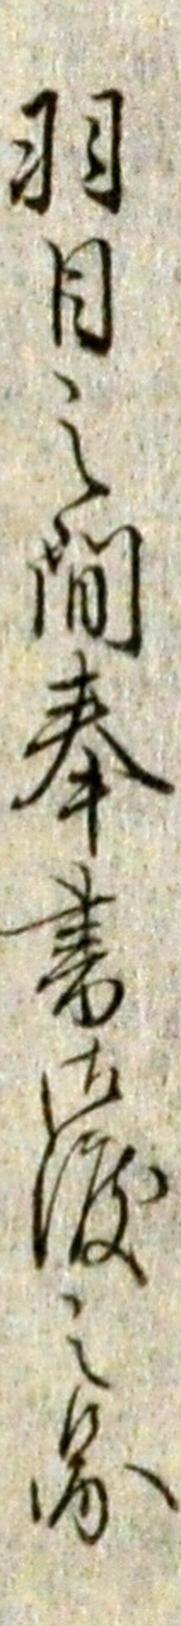羽目之間奉書御渡之図

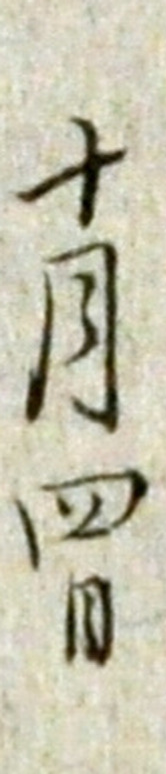十月四日
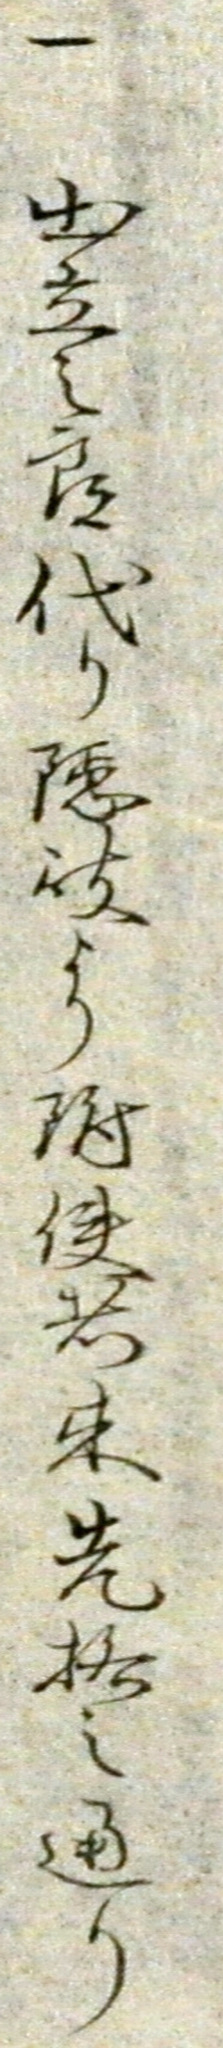一出立之節代り隠岐より附使者来先格之通り
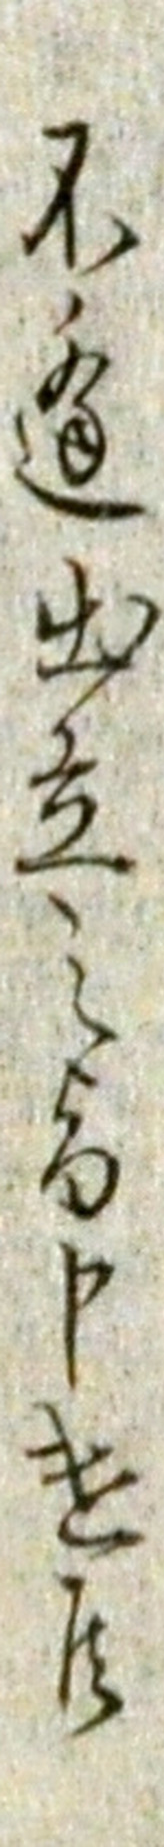不逢出立之旨申遣候
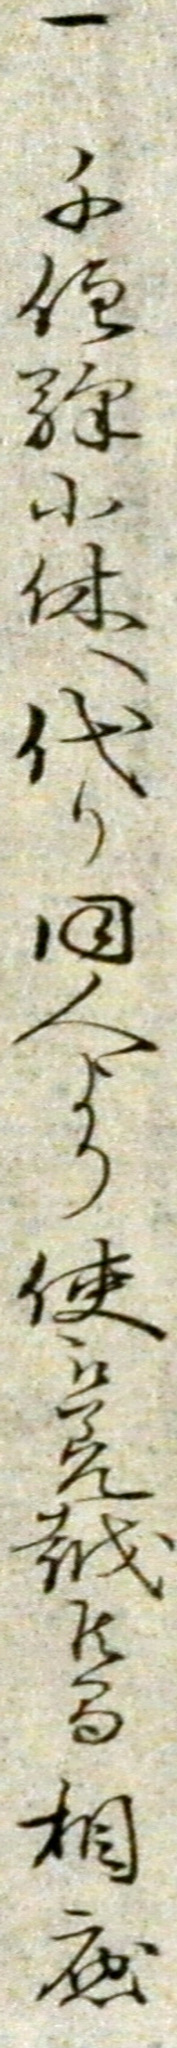一千住駅小休へ代り同人より使被差越候間相応
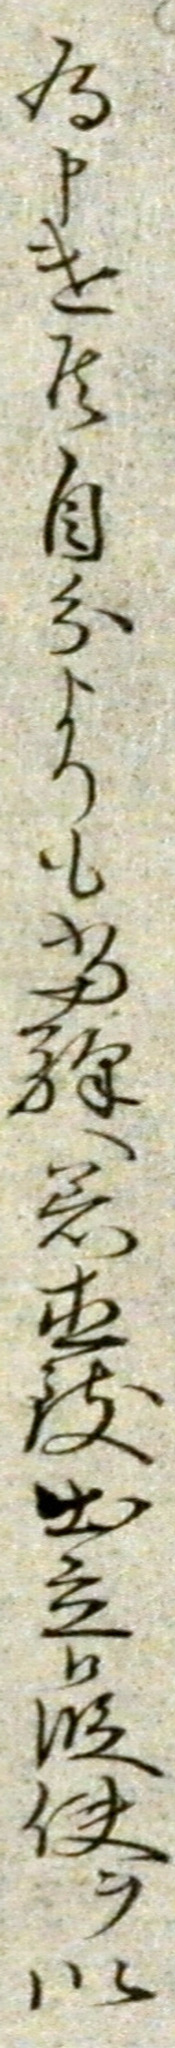為申遣共自分よりも当駅へ着直致出立候段使ヲ以
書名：日光御名代相勤候節ノ留
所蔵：伊那市立高遠町図書館・合同会社AMANE
